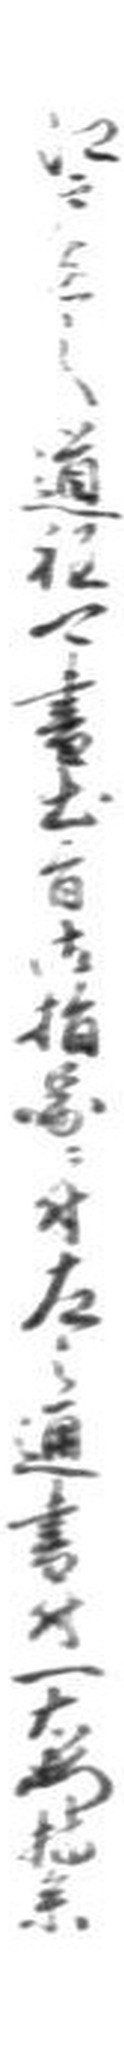江戸迄之道程可書出旨御指図ニ付左之通書付一右衛門持参
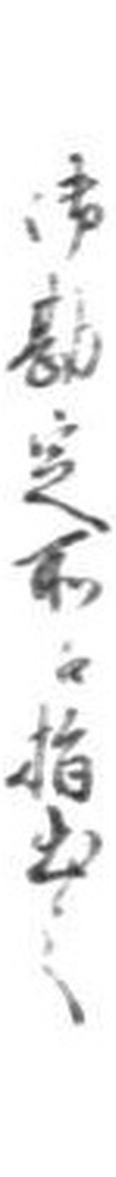御勘定所江指出之
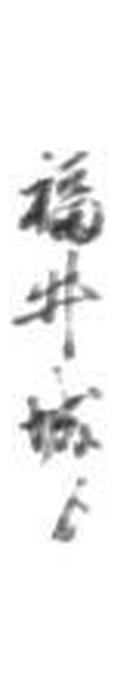福井城ゟ
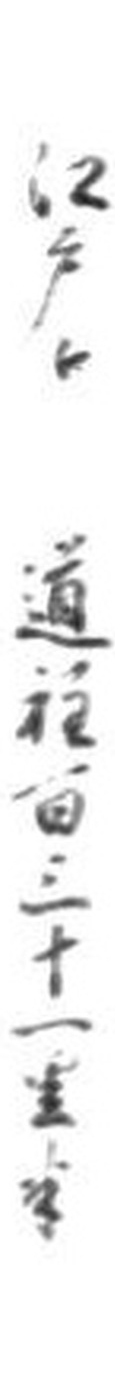江戸江道程百三十一里半
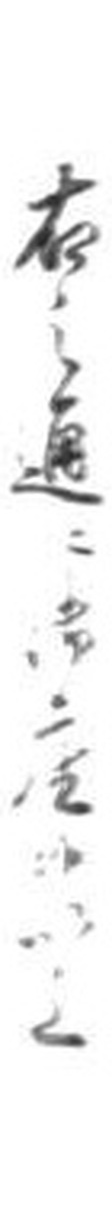右之通ニ御座候以上
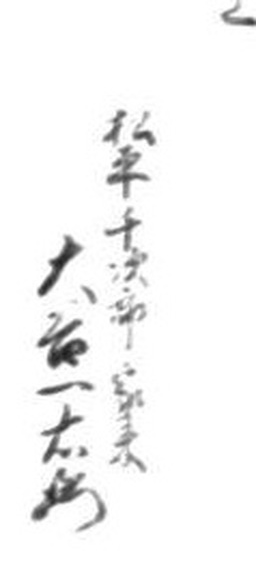松平千次郎家来

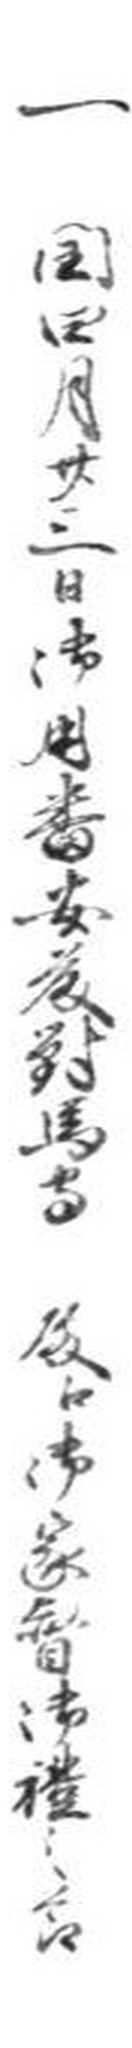一閏四月廿三日御用番安藤対馬守殿江御家督御礼之節
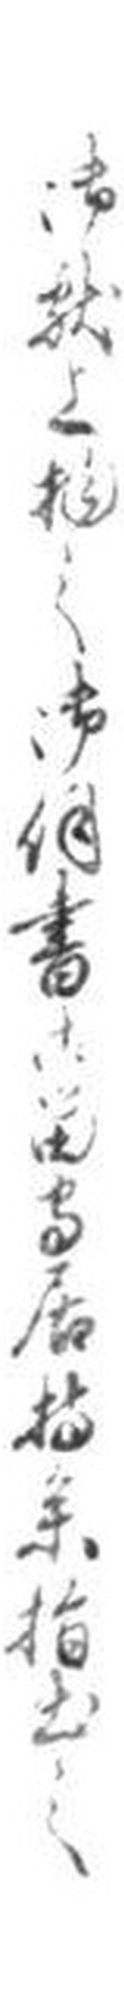御献上物之御伺書御留守居持参指出之
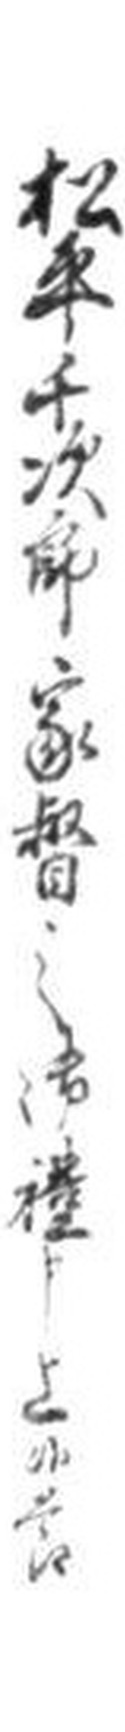松平千次郎家督之御礼申上候節
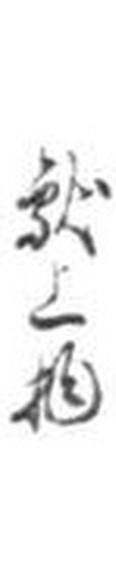献上物
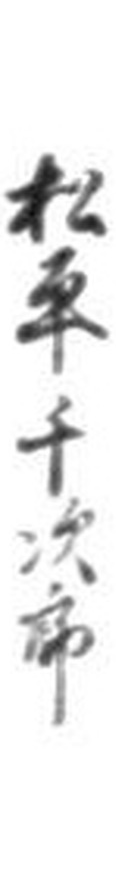松平千次郎
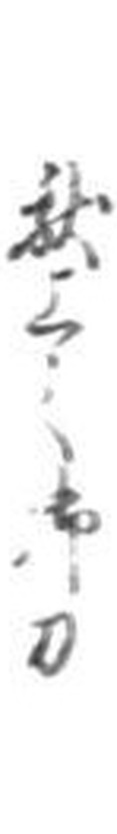献上之御刀
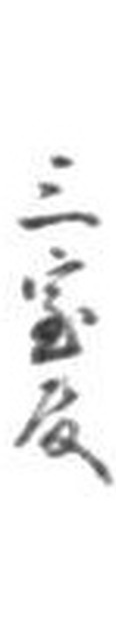三室殿
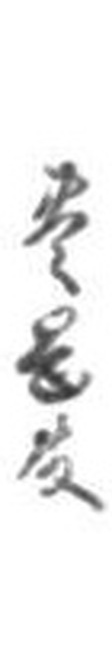豊岡殿

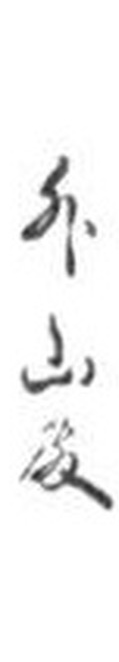外山殿
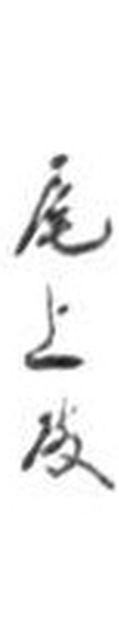尾上殿
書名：家譜 三十七 宗矩公 従正徳五年到享保九年五月
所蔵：福井県文書館 Fukui Prefectural Archives
